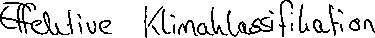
Effektive Klimaklassifikation
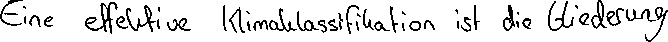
Eine effektive Klimaklassifikation ist die Gliederung
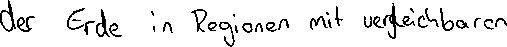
der Erde in Regionen mit vergleichbaren
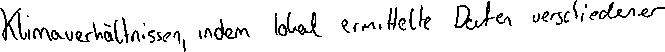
Klimaverhältnissen, indem lokal ermittelte Daten verschiedener
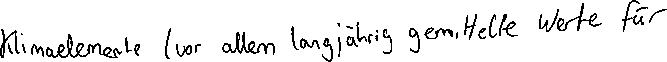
Klimaelemente (vor allem langjährig gemittelte Werte für
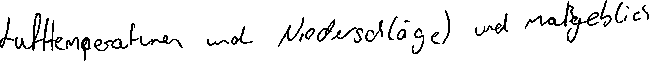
Lufttemperaturen und Niederschläge) und maßgeblich
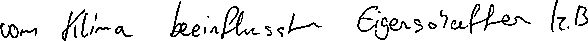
vom Klima beeinflussten Eigenschaften (z.B
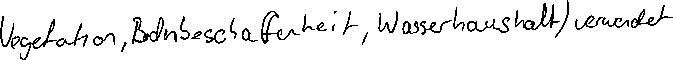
Vegetation, Bodenbeschaffenheit, Wasserhaushalt) verwendet
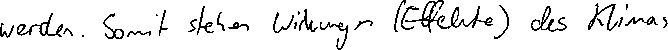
werden. Somit stehen die Wirkungen (Effekte) des Klimas
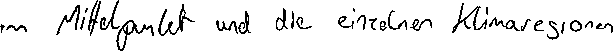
im Mittelpunkt und die einzelnen Klimaregionen
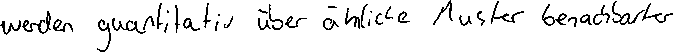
werden quantitativ über ähnliche Muster benachbarter
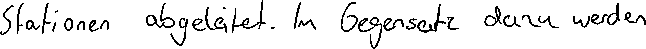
Stationen abgeleitet. Im Gegensatz dazu werden
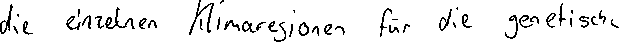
die einzelnen Klimaregionen für die genetische
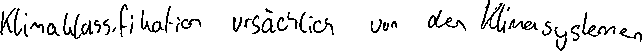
Klimaklassifikation ursächlich von den Klimasystemen
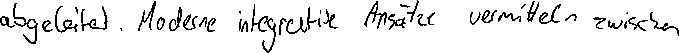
abgeleitet. Moderne integrative Ansätze vermitteln zwischen
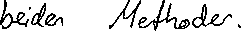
beiden Methoden.
